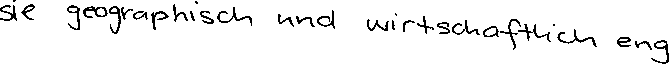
sie geographisch und wirtschaftlich eng
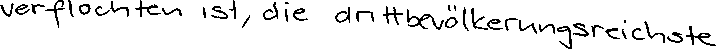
verflochten ist, die drittbevölkerungsreichste
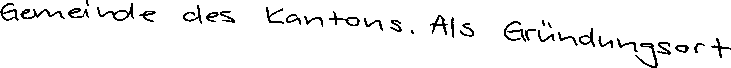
Gemeinde des Kantons. Als Gründungsort
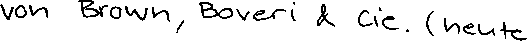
von Brown, Boveri & Cie. (heute
